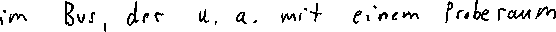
im Bus, der u. a. mit einem Proberaum
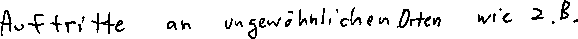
Auftritte an ungewöhnlichen Orten wie z. B.
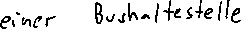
einer Bushaltestelle
